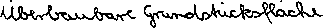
Überbaubare Grundstücksfläche
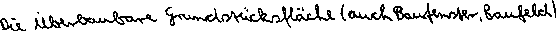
Die Überbaubare Grundstücksfläche (auch Baufenster, Baufeld)
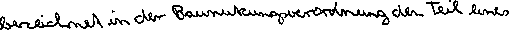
bezeichnet in der Baunutzungsverordnung den Teil eines
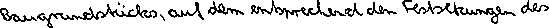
Baugrundstücks, auf dem entsprechend den Festsetzungen des
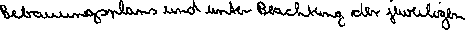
Bebauungsplans und unter Beachtung der jeweiligen
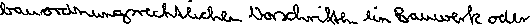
bauordnungsrechtlichen Vorschriften ein Bauwerk oder
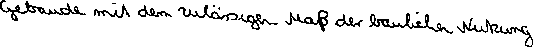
Gebäude mit dem zulässigen Maß der baulichen Nutzung
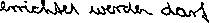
errichtet werden darf.
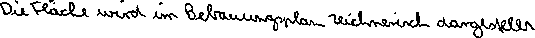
Die Fläche wird im Bebauungsplan zeichnerisch dargestellt
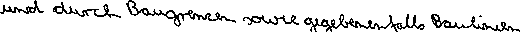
und durch Baugrenzen sowie gegebenenfalls Baulinien
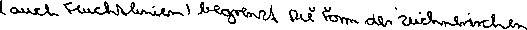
(auch Fluchtlinien) begrenzt. Die Form der zeichnerischen
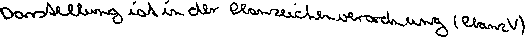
Darstellung ist in der Planzeichenverordnung (PlanzV)
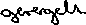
geregelt.
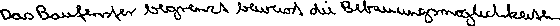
Das Baufenster begrenzt bewusst die Bebauungsmöglichkeiten
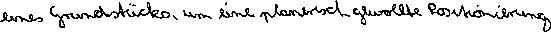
eines Grundstücks, um eine planerisch gewollte Positionierung
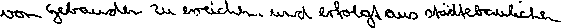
von Gebäuden zu erreichen, und erfolgt aus städtebaulichen
